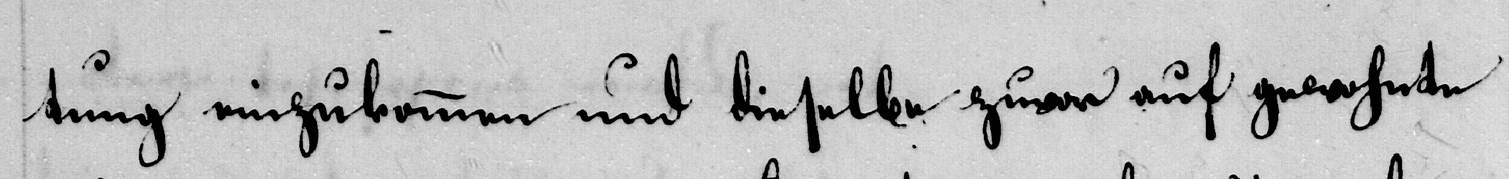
tung einzukommen und dieselbe zuvor auf gewohnte
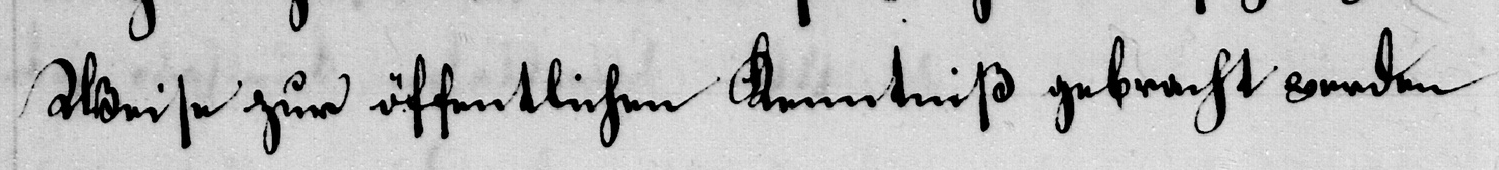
Weise zur öffentlichen Kenntniß gebracht werden
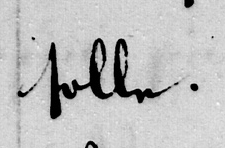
solle.
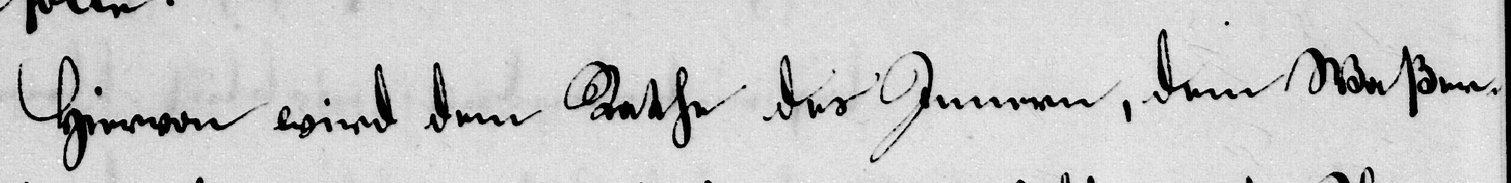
Hiervon wird dem Rathe des Innern, dem Waßer¬
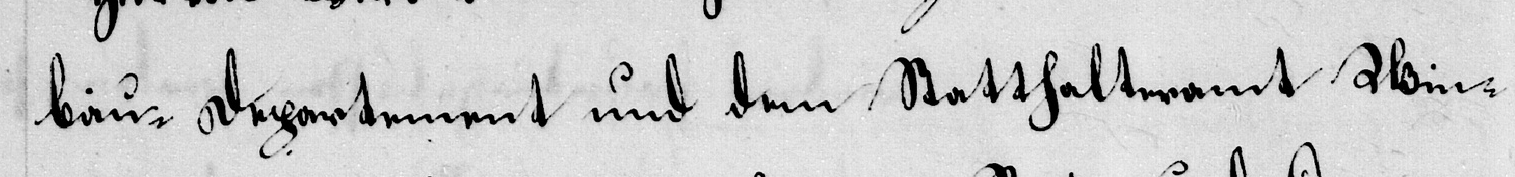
bau-Departement und dem Statthalteramt Win¬
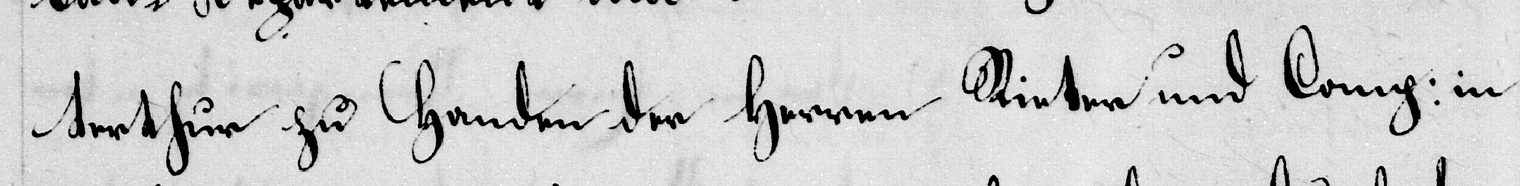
terthur zu Handen der Herren Rieter und Comp. in
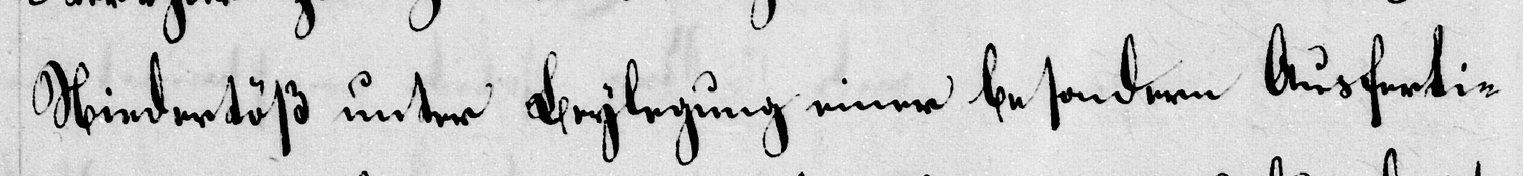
Niedertöß unter Beylegung einer besondern Ausferti¬
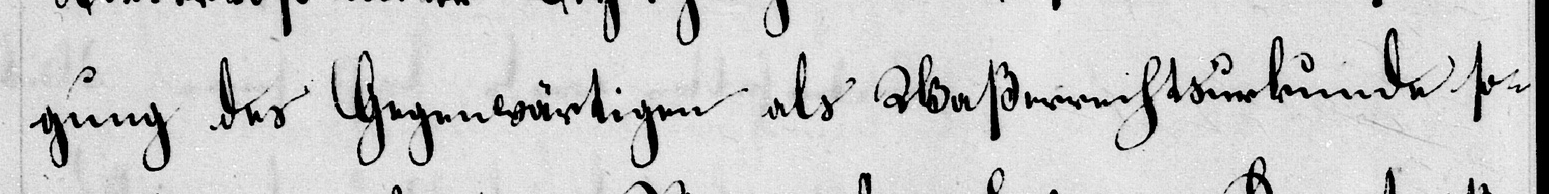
gung des Gegenwärtigen als Waßerrechtsurkunde so¬
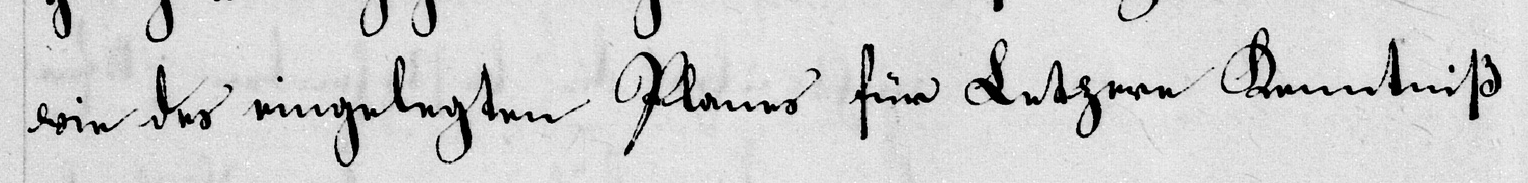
wie des eingelegten Planes für Letzere Kenntniß
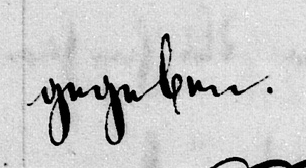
gegeben.
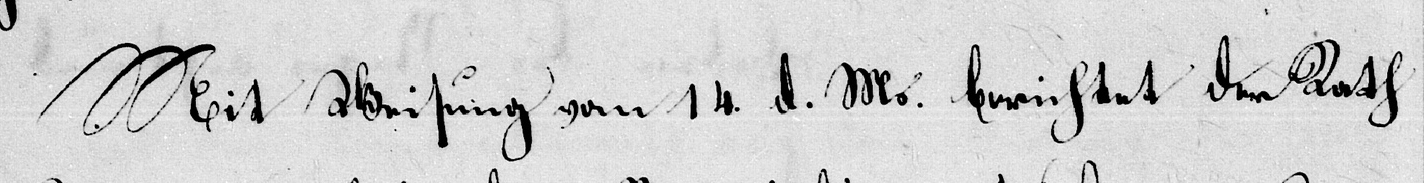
Mit Weisung vom 14. d. Ms. berichtet der Rath
